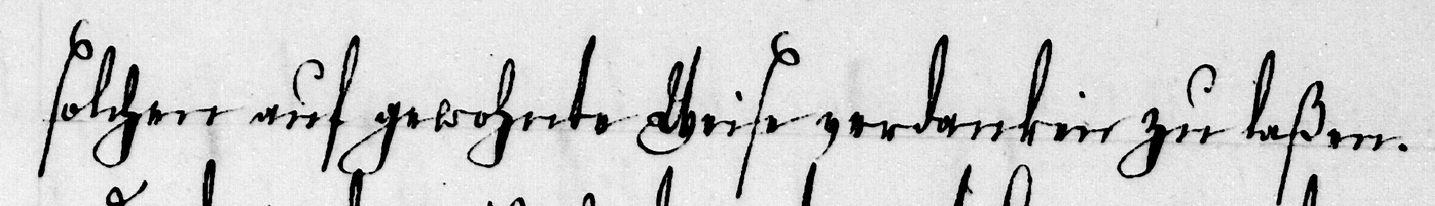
solchen auf gewohnte Weise verdanken zu laßen.
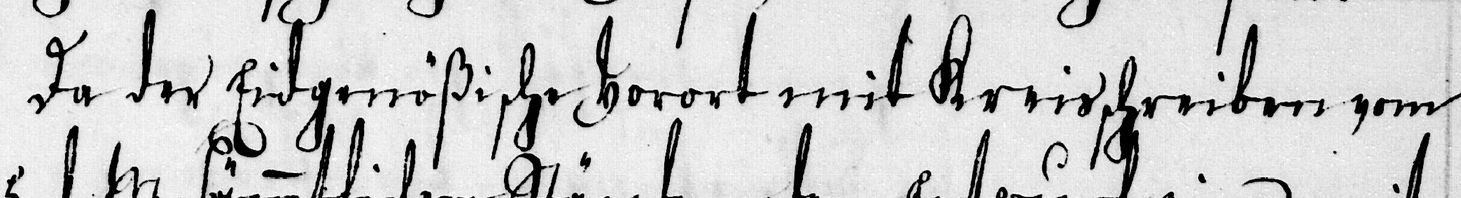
Da der Eidgenößische Vorort mit Kreisschreiben vom
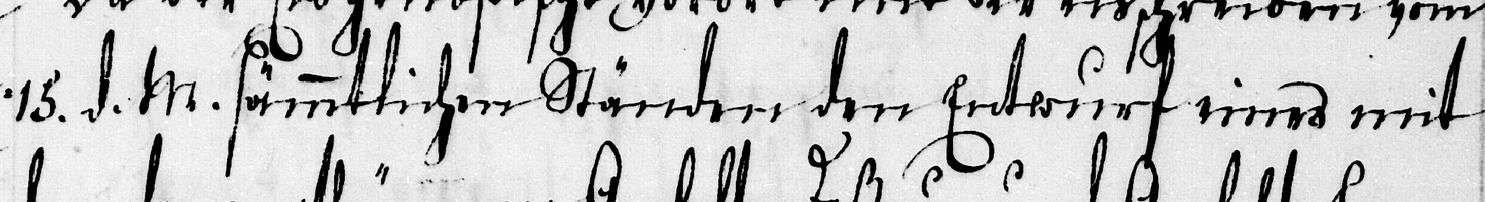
15. d. M. sämmtlichen Ständen den Entwurf eines mit
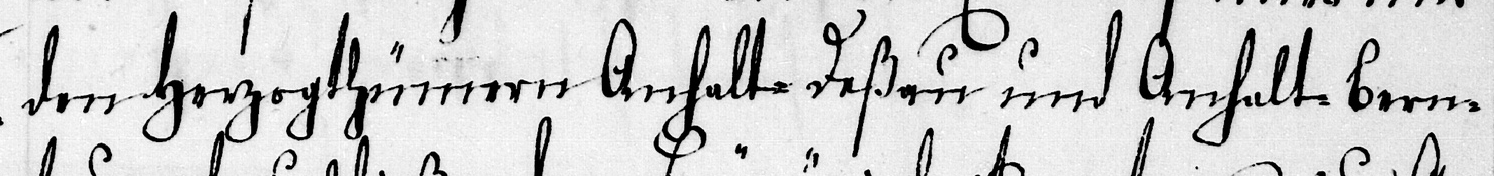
den Herzogthümern Anhalt-Deßau und Anhalt-Bern¬
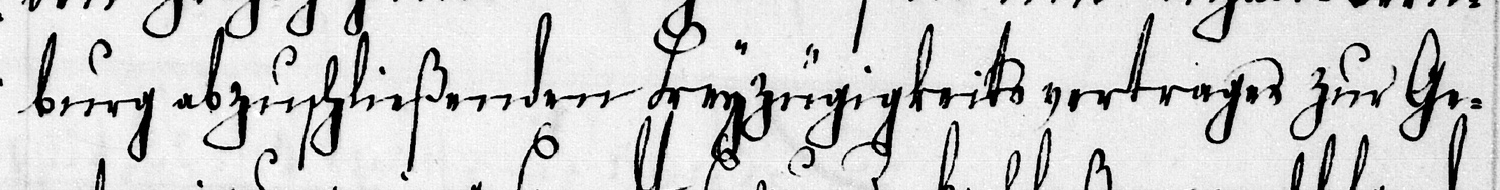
burg abzuschließenden Freyzügigkeitsvertrages zur Ge¬
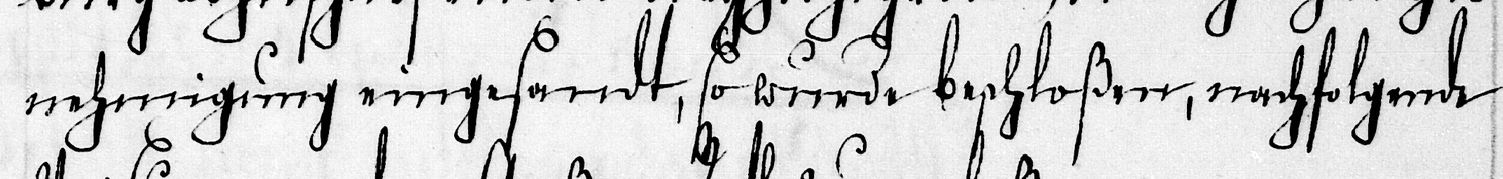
nehmigung eingesandt, so wurde beschloßen, nachfolgende
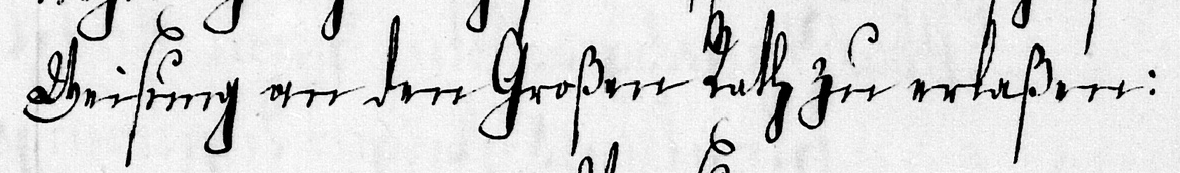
Weisung an den Großen Rath zu erlaßen:
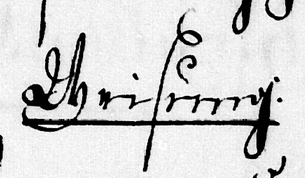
Weisung:
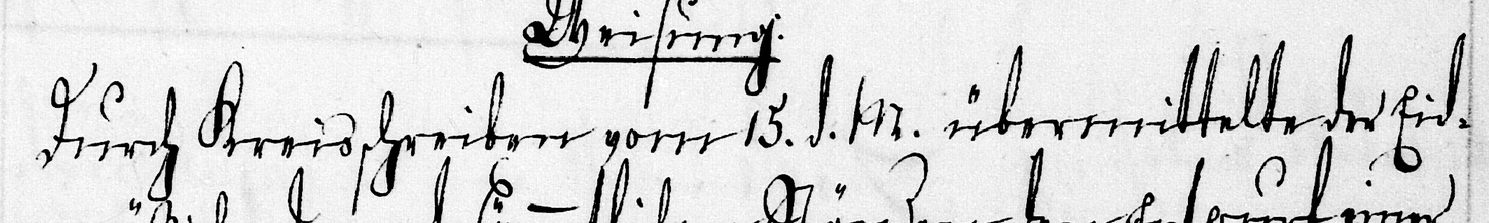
Durch Kreisschreiben vom 15. d. M. übermittelte der Eid¬
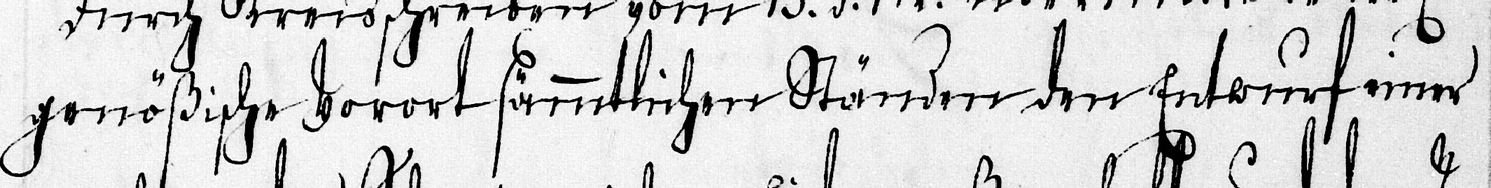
genößische Vorort sämmtlichen Ständen den Entwurf einer
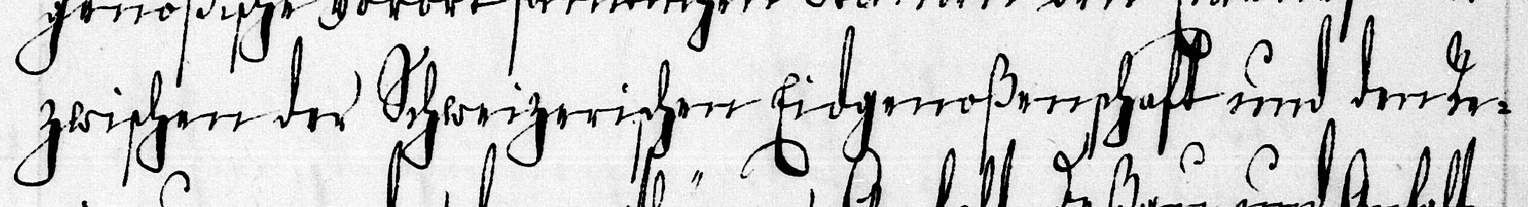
zwischen der Schweizerischen Eidgenoßenschaft und den Re¬
